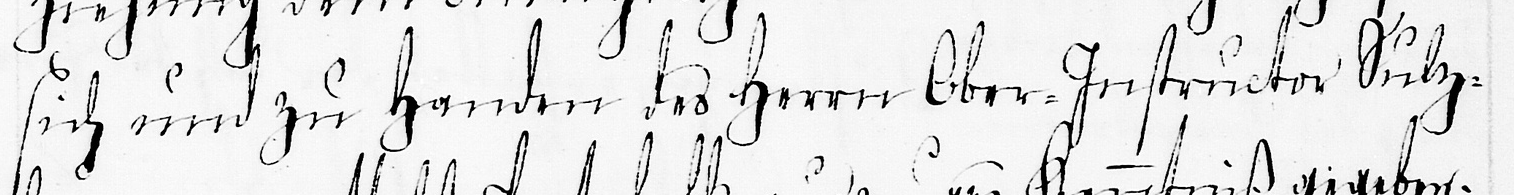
sich und zu Handen des Herrn Ober-Instructor Sulz¬
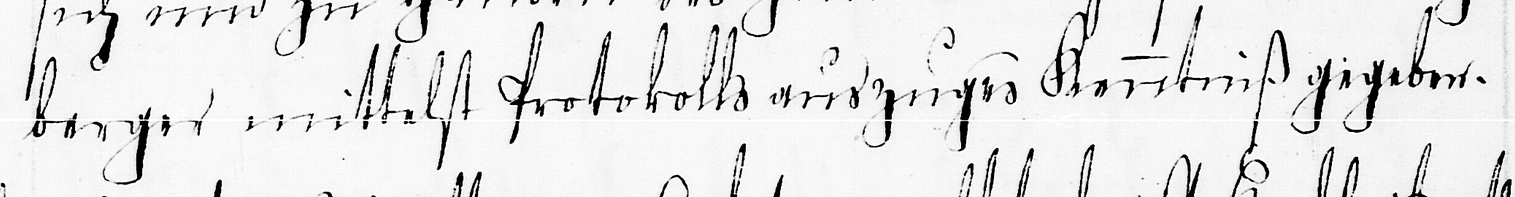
berger mittelst Protokollsauszuges Kenntniß gegeben.
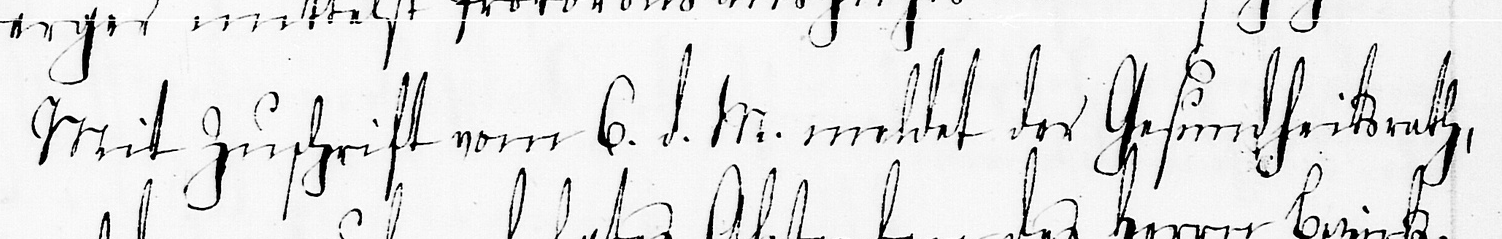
Mit Zuschrift vom 6. d. M. meldet der Gesundheitsrath,
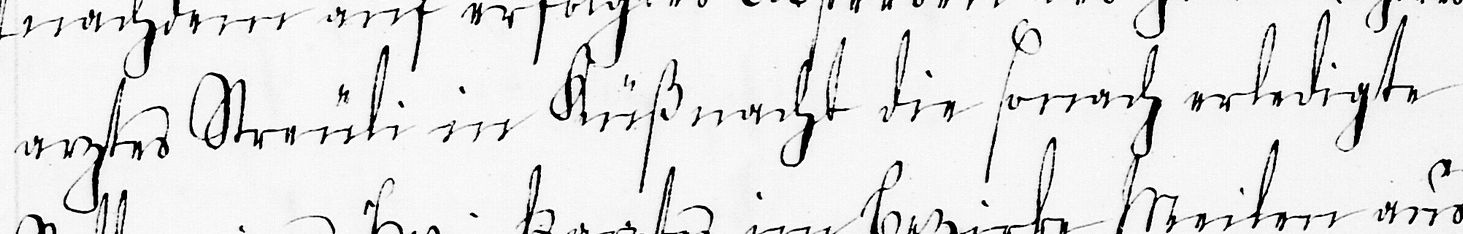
arztes Streuli in Küßnacht die sonach erledigte
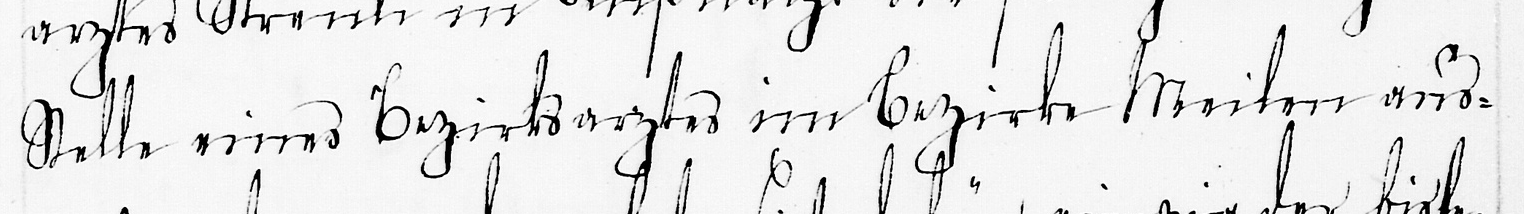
Stelle eines Bezirksarztes im Bezirke Meilen aus¬
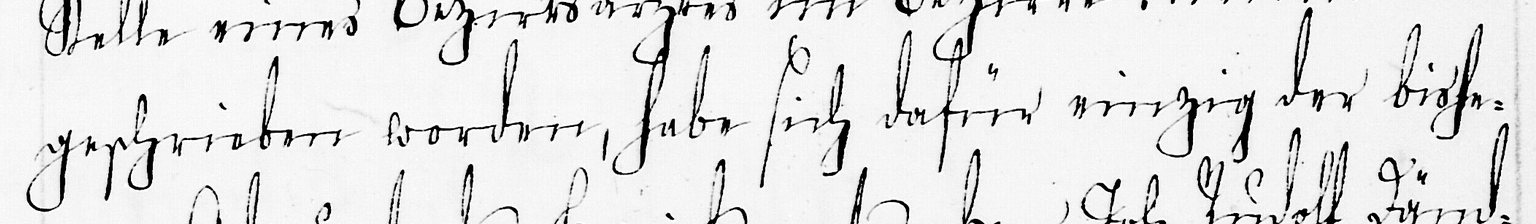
geschrieben worden, habe sich dafür einzig der bishe¬
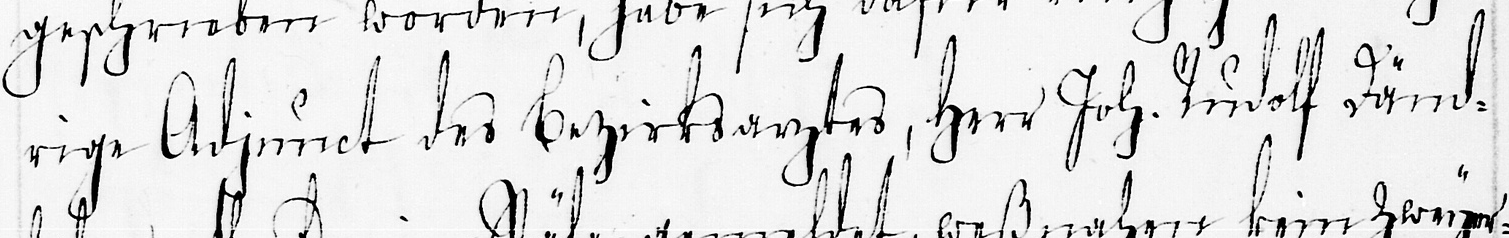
rige Adjunct des Bezirksrathes, Herr. Joh. Rudolf Dänd¬
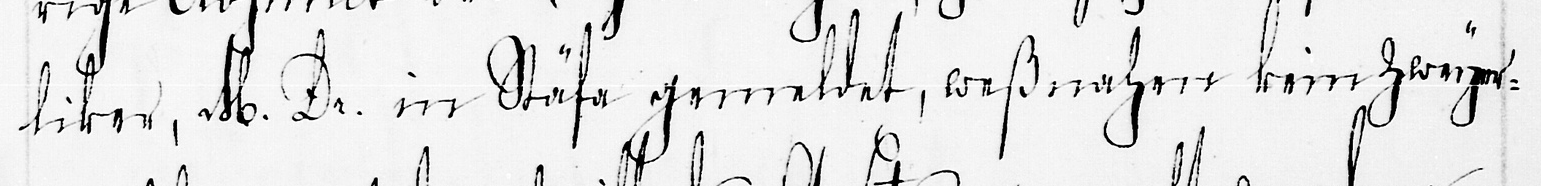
liker, M. Dr. in Stäfa gemeldet, weßnahen kein Zweyer¬
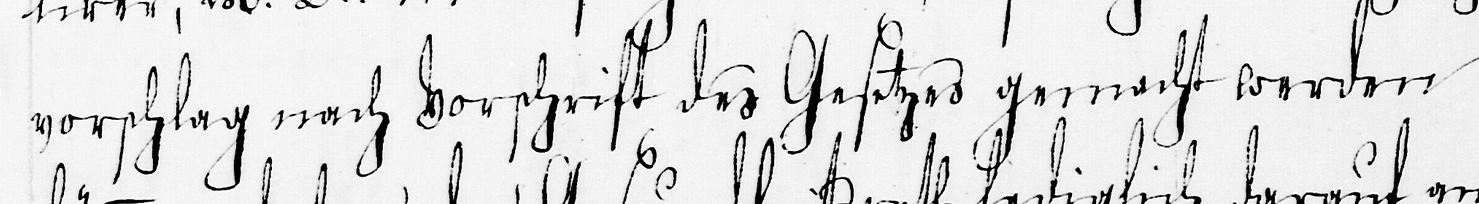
vorschlag nach Vorschrift des Gesetzes gemacht werden
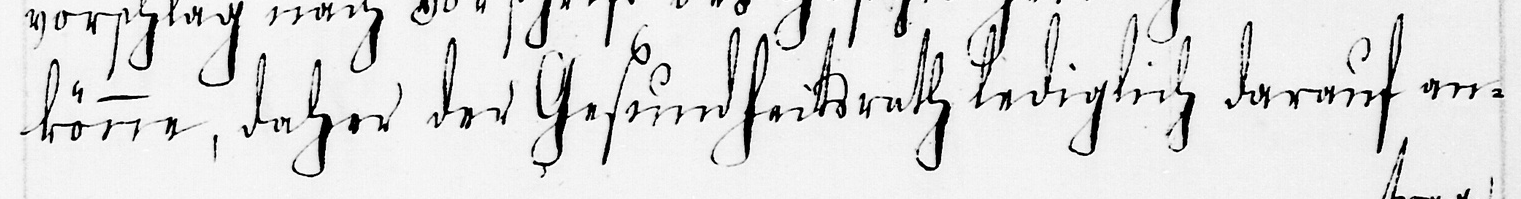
könne, daher der Gesundheitsrath lediglich darauf an-
